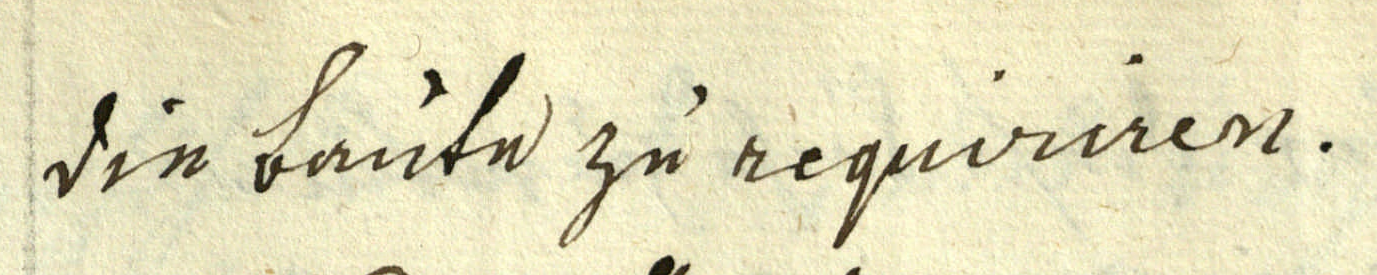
die Baute zu requiriren.
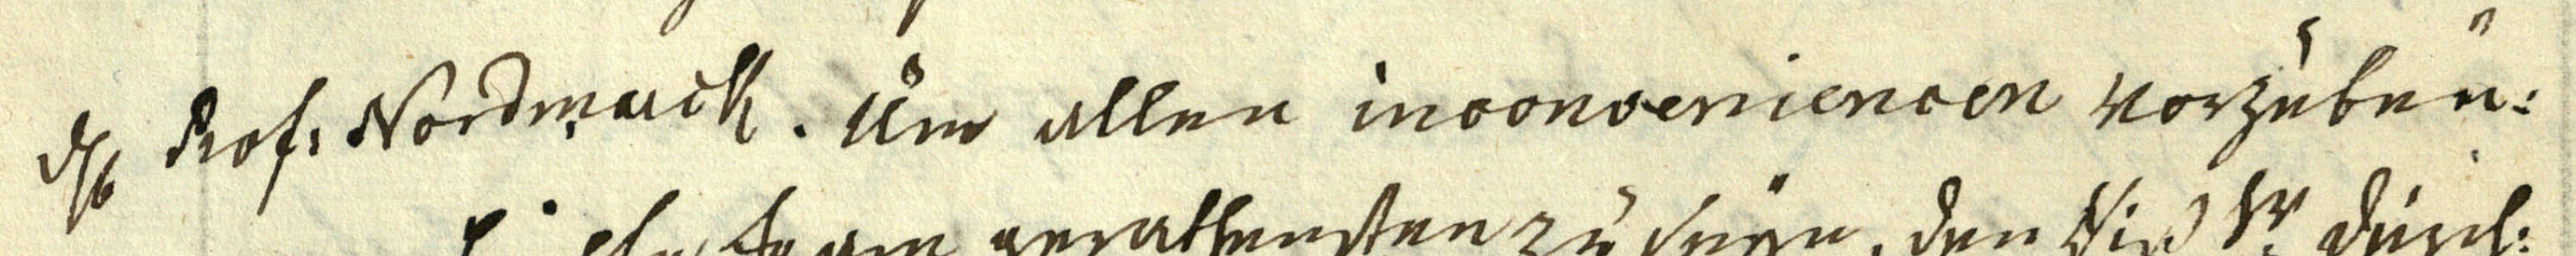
dh Prof. Nordmarck. Um allen inconveniencen vorzubeu¬
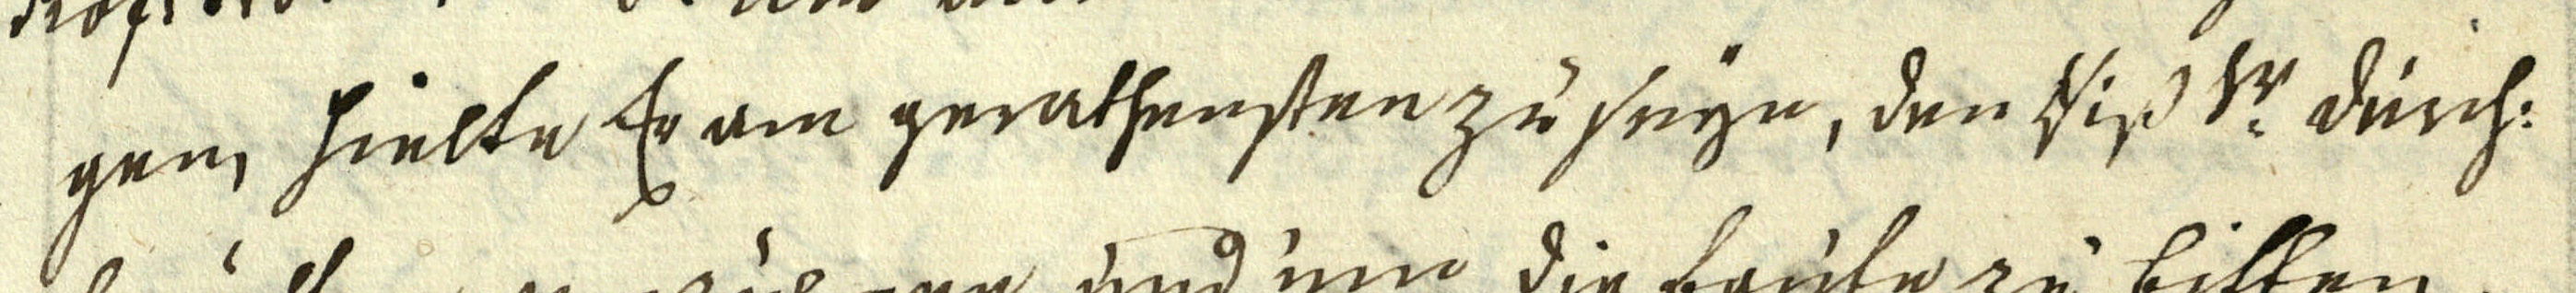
gen, hielte Er am gerathensten zu seÿn, den Riß Sr Durch¬
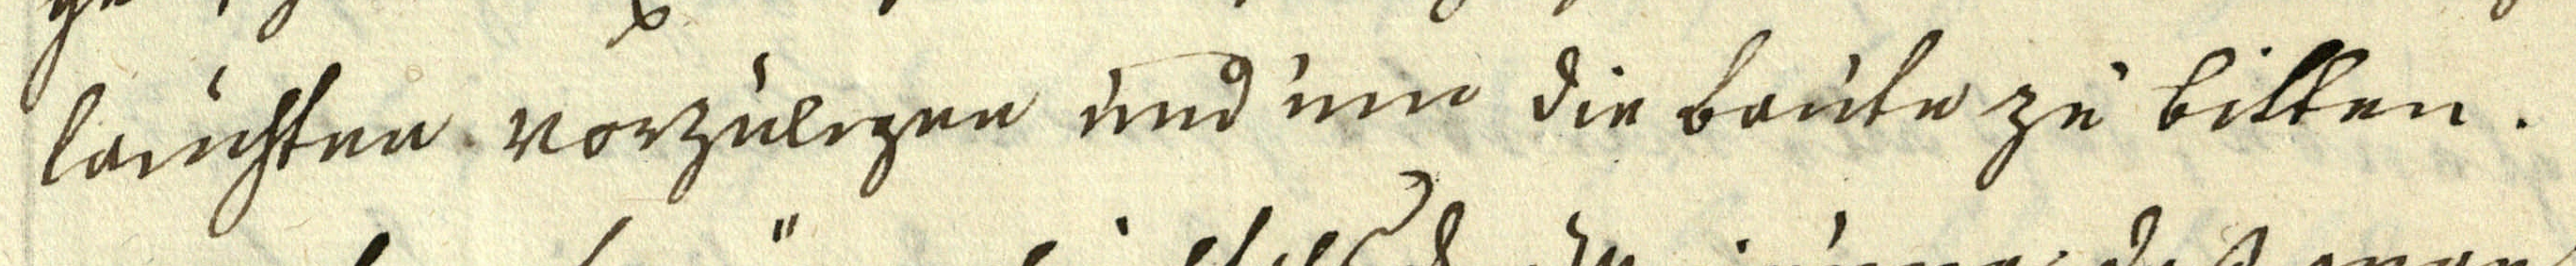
lauchten vorzulegen und in die Baute zu bitten.
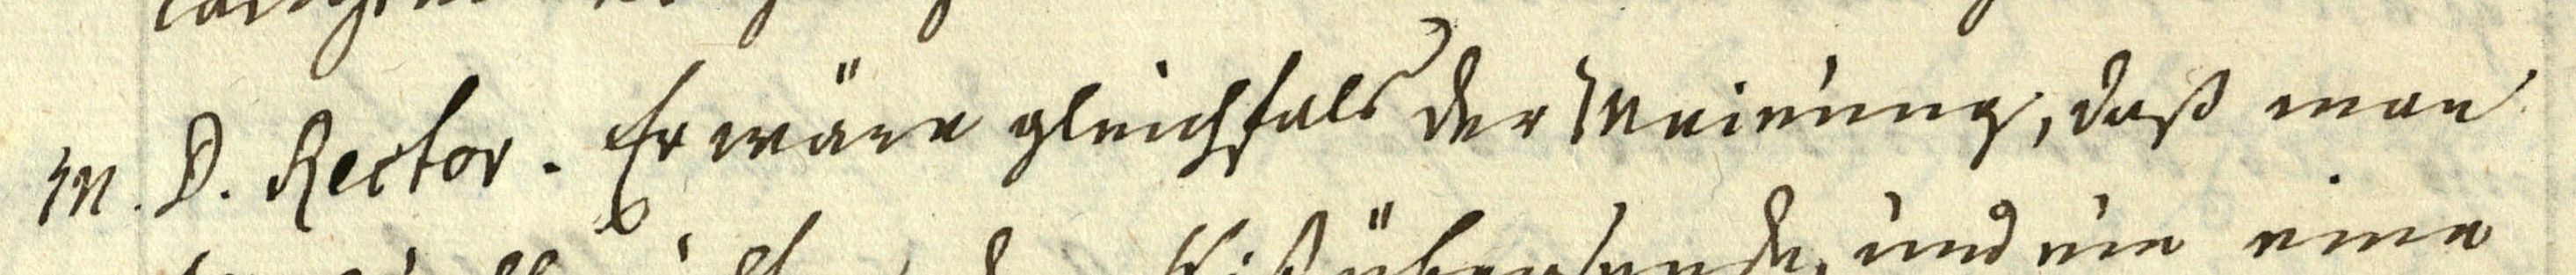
M. D. Rector. Er wäre gleichfals der Meinung, daß man
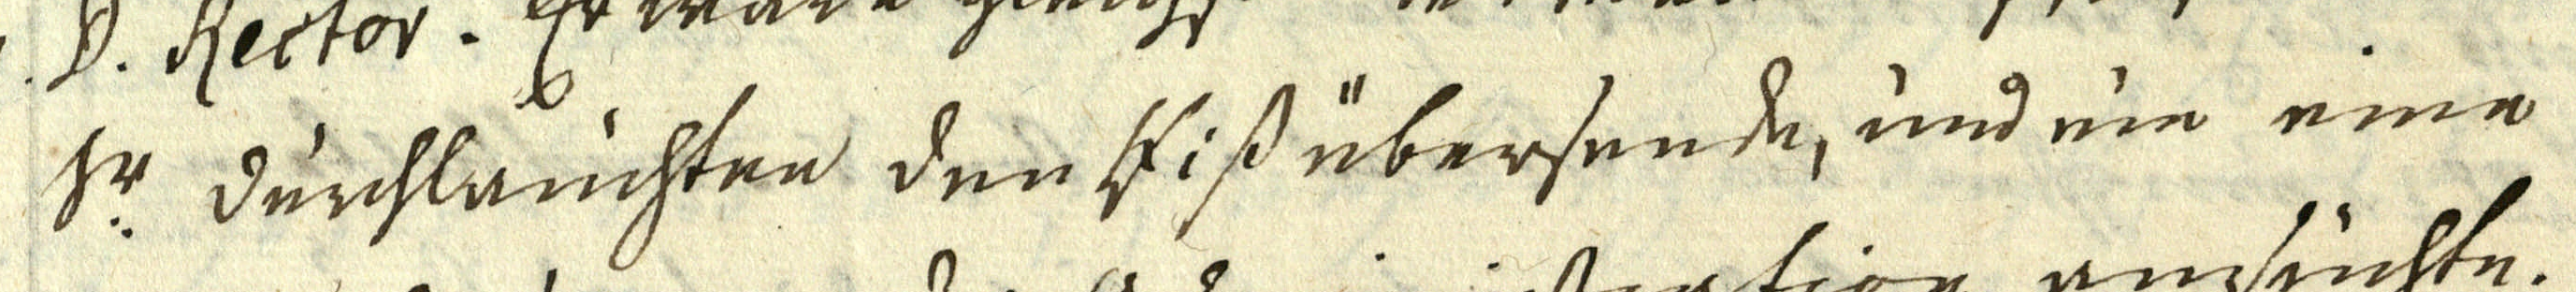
Sr. Durchlauchten den Riß übersende, und um eine
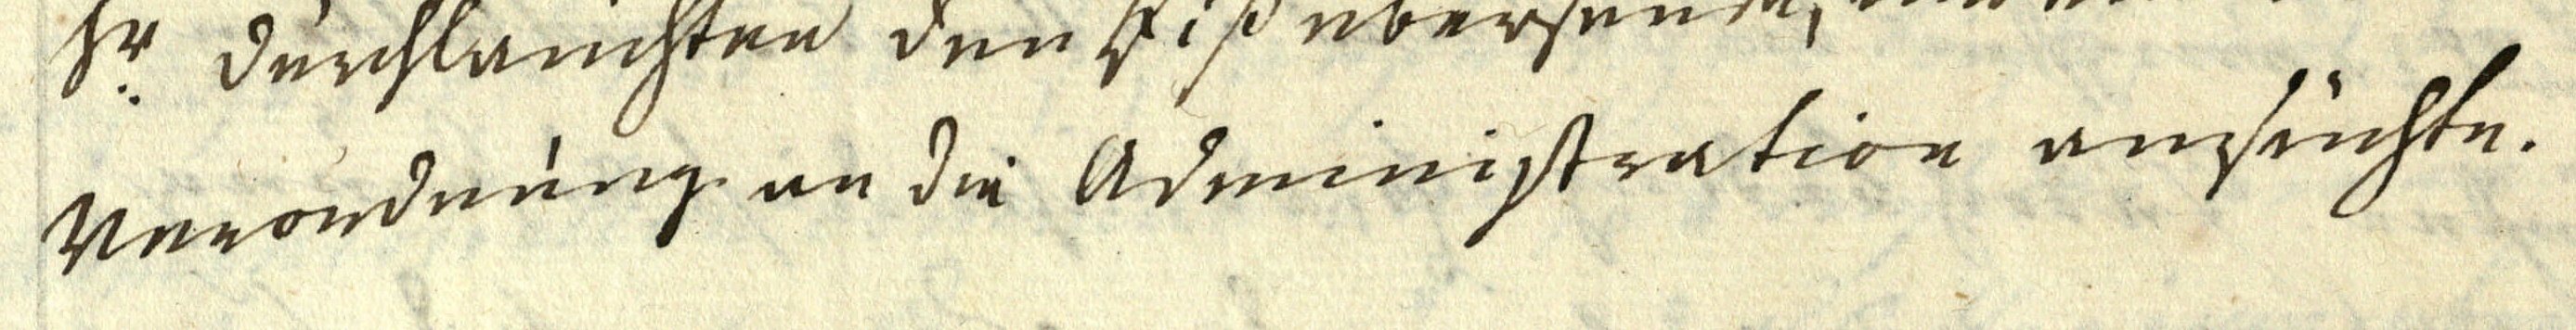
Verordnung an die Administration ansuchte.
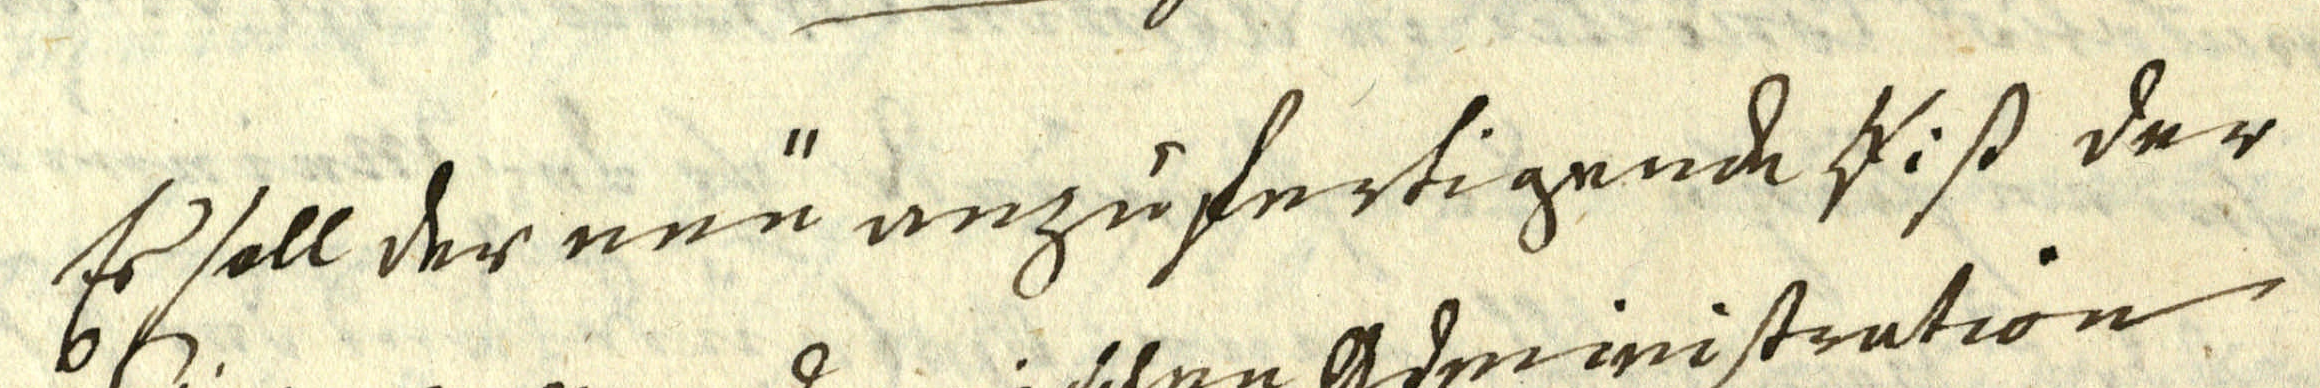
Es soll der neu anzufertigende Riß der
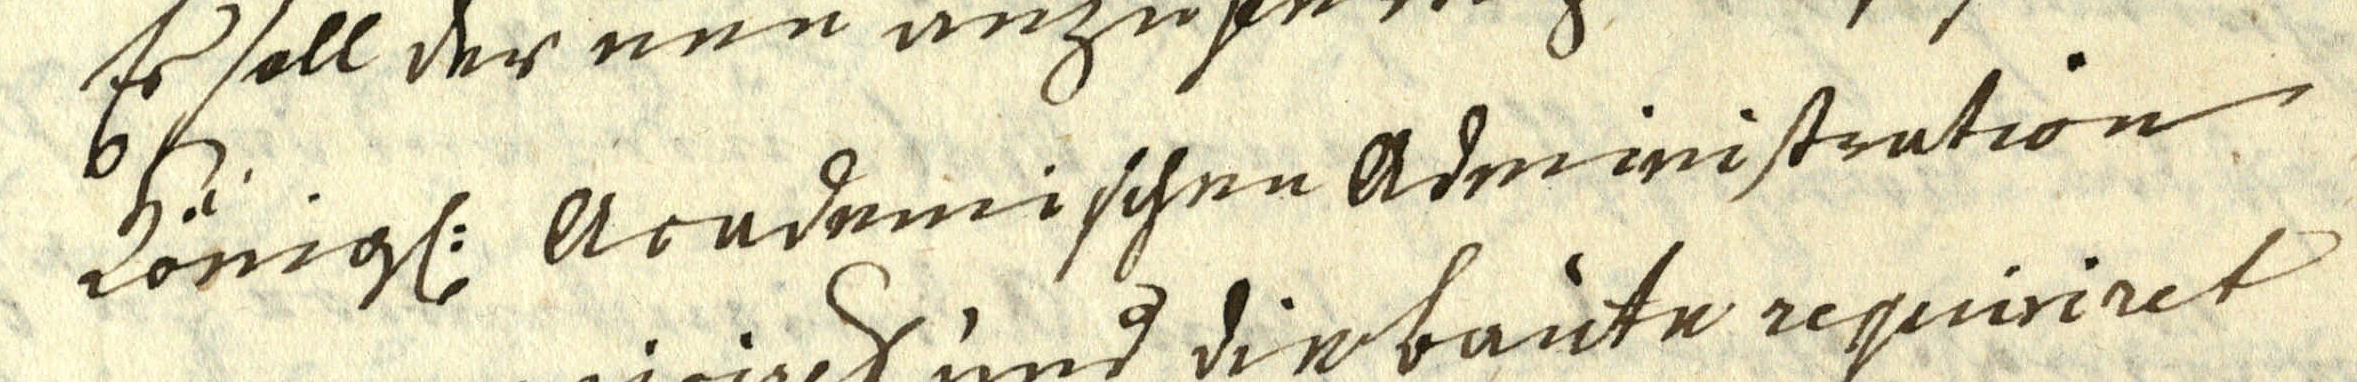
Königl. Academischen Administration
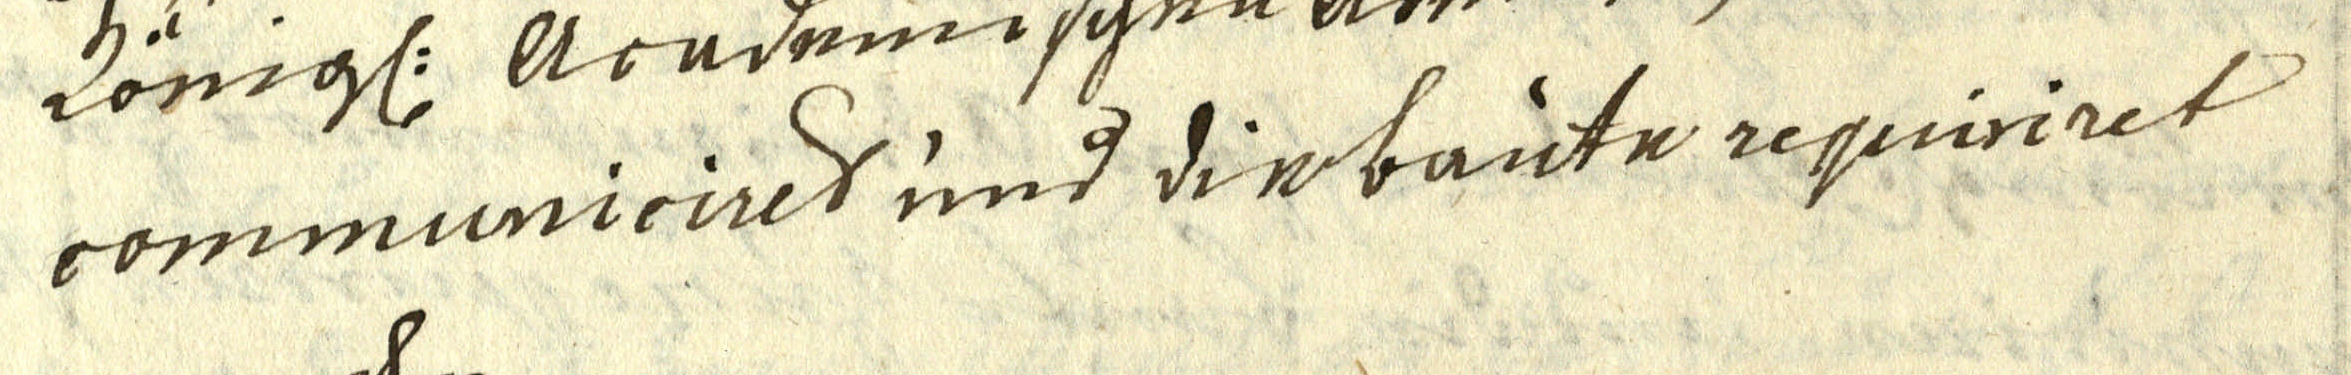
communiciret und dieBaute requiriret
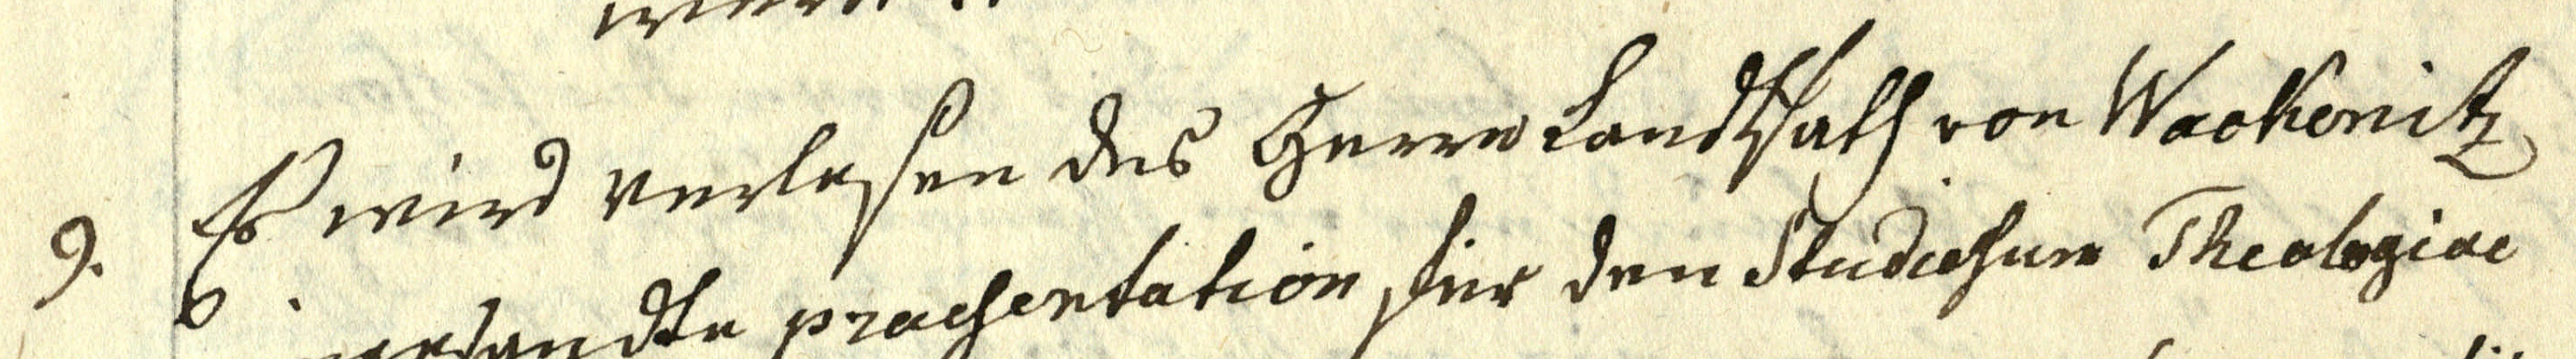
9. Es wird verlesen des Herrn LandRath von Wackenitz
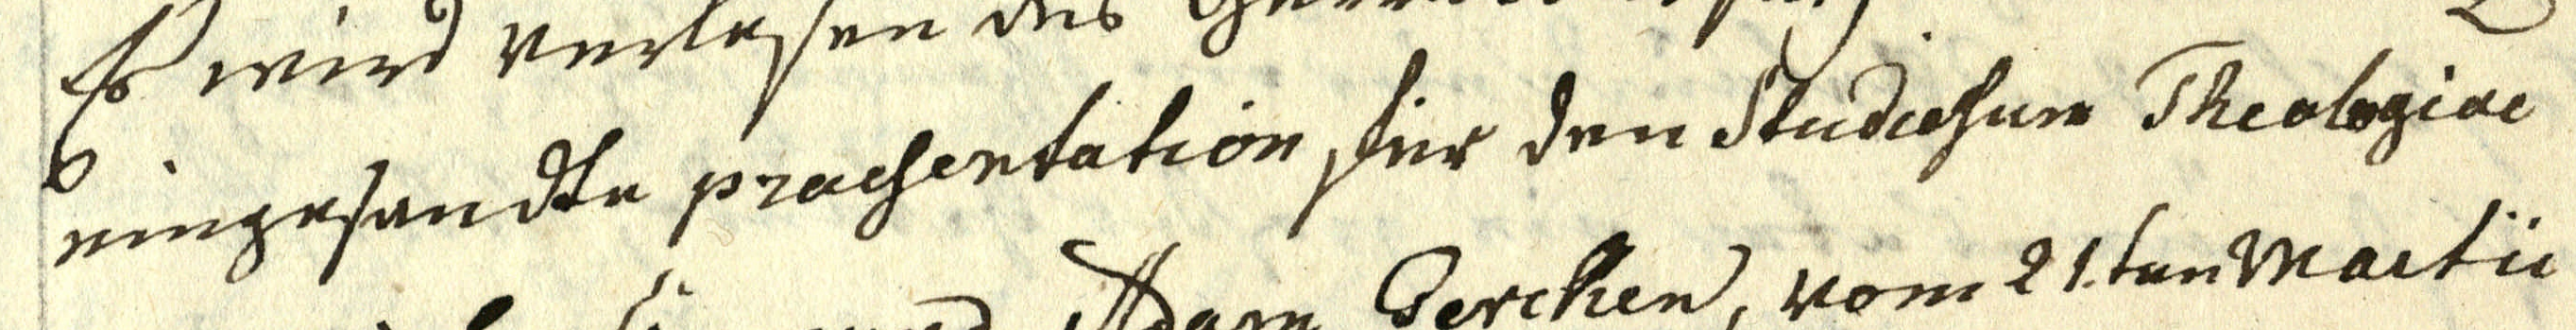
eingesandte praesentation für den Studiosum Theologiae
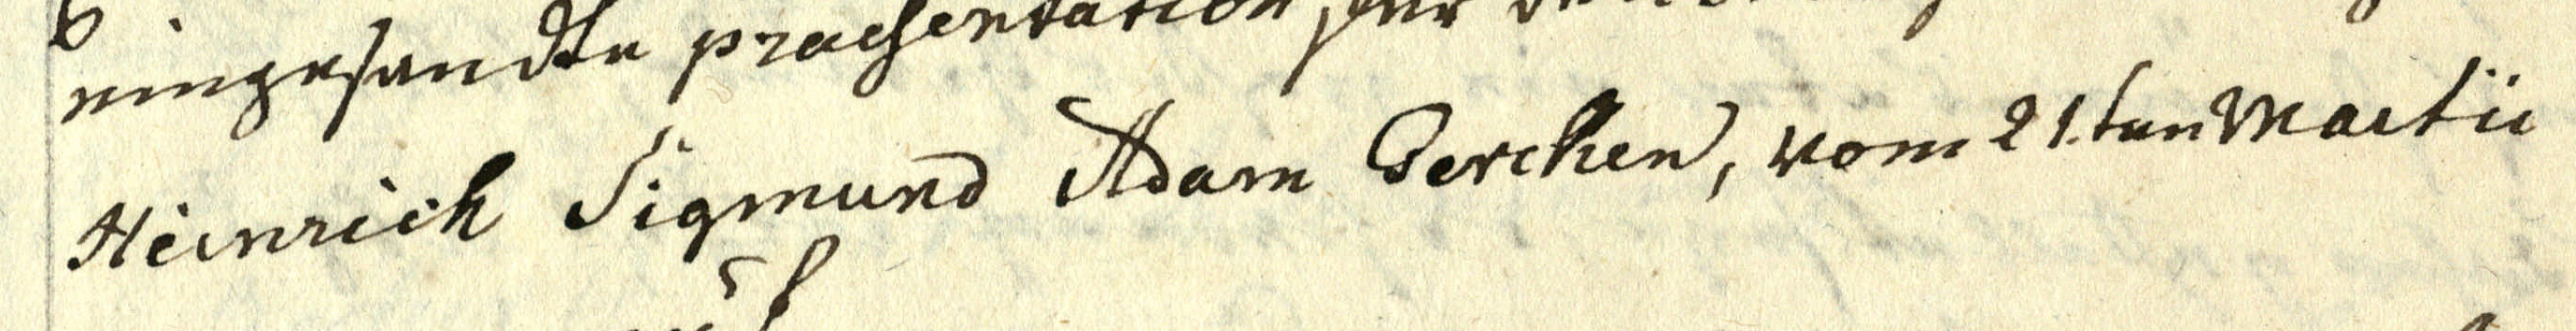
Heinrich Sigmund Adam Gercken, vom 21 ten Martii
